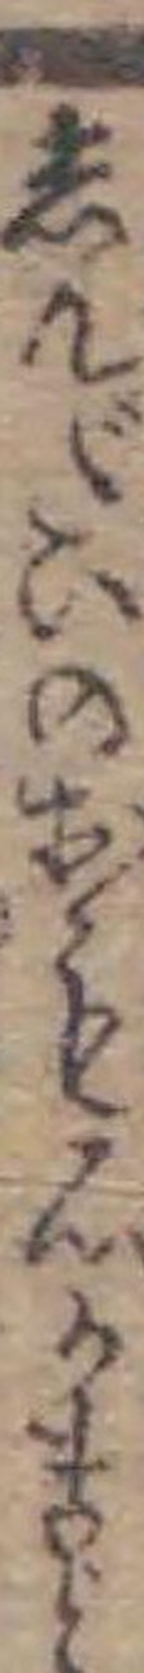しんだいのおもいしかまど
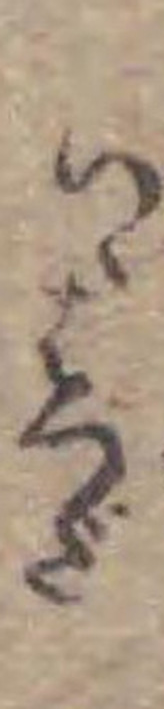いゝはつだ
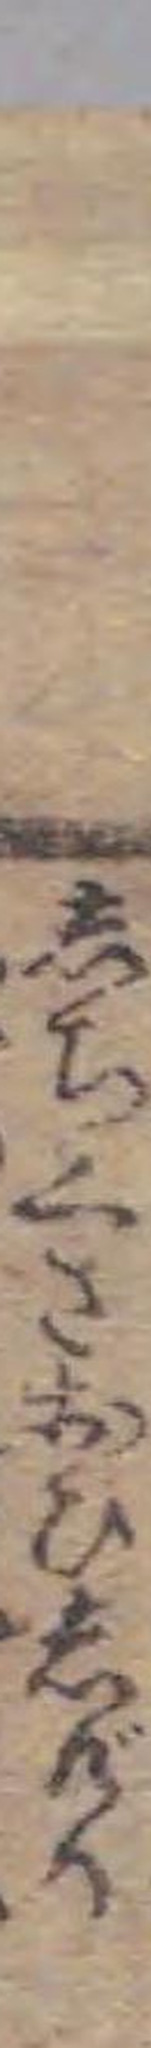しちくさおひしげり
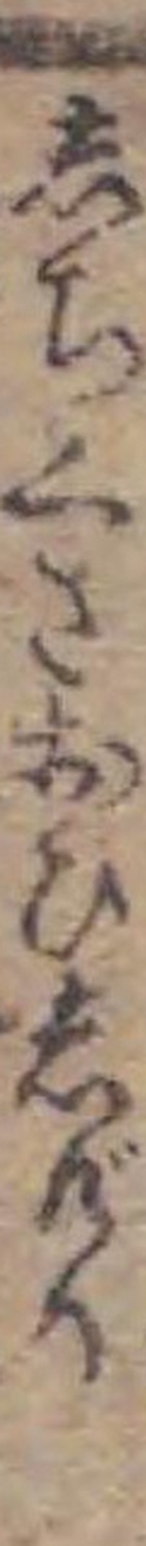しちくさおひしげり
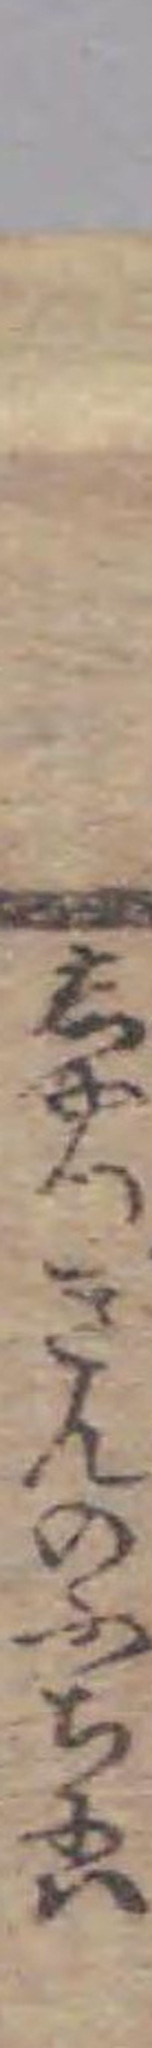しやつきんのふちには
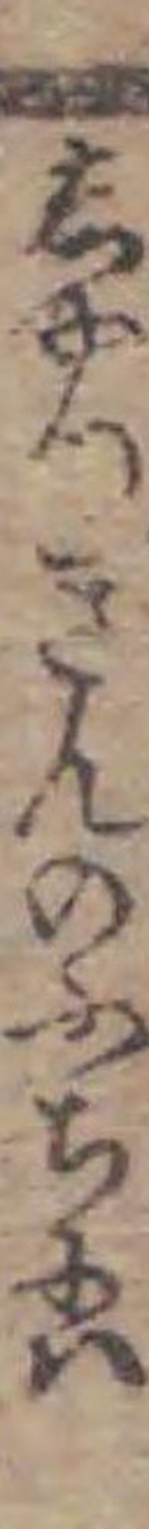しやつきんのふちには
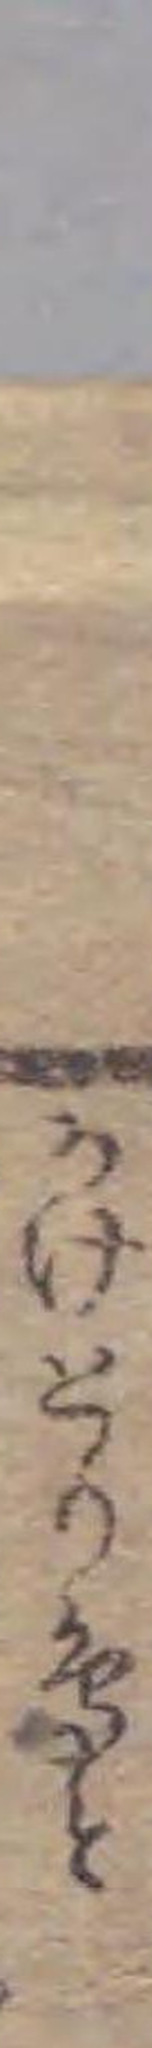かけとり鳥と
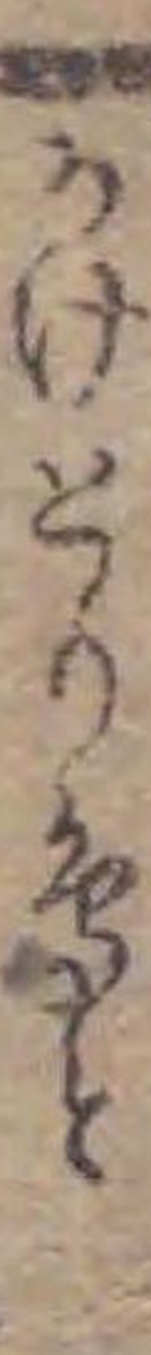かけとり鳥と
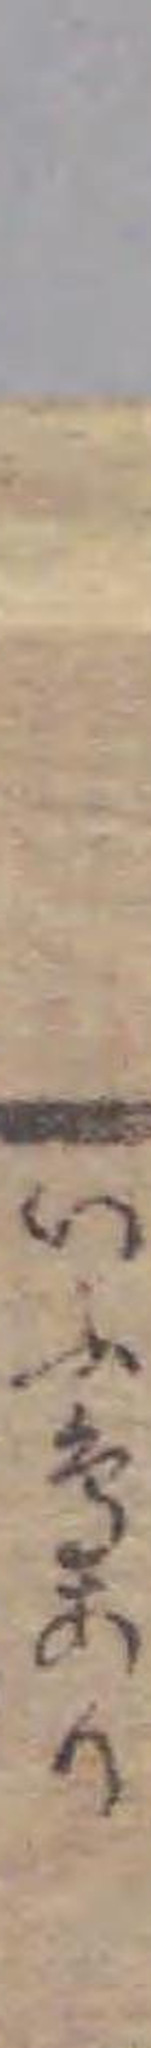いふ鳥あり
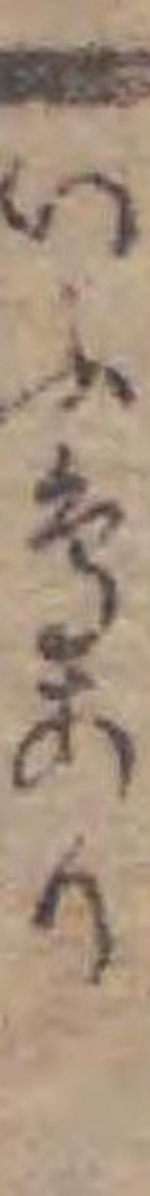いふ鳥あり
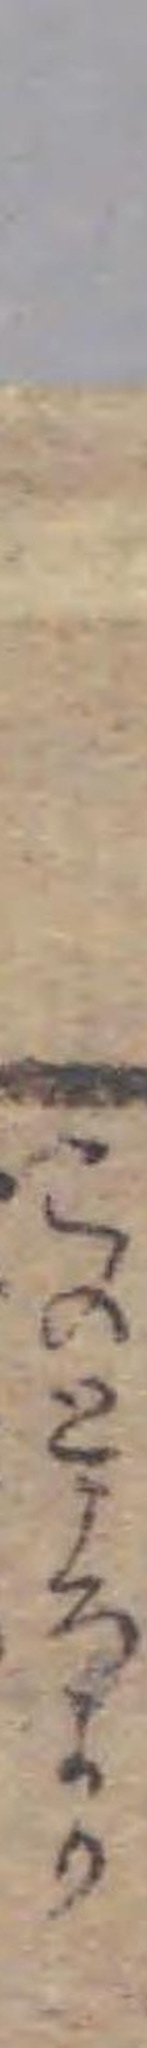このところより
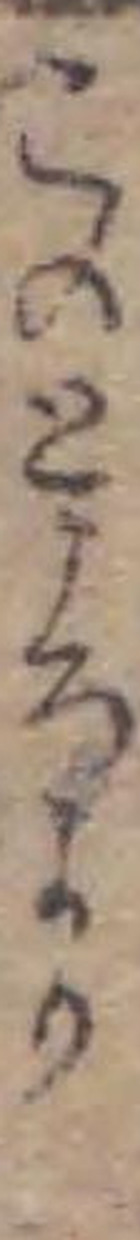このところより
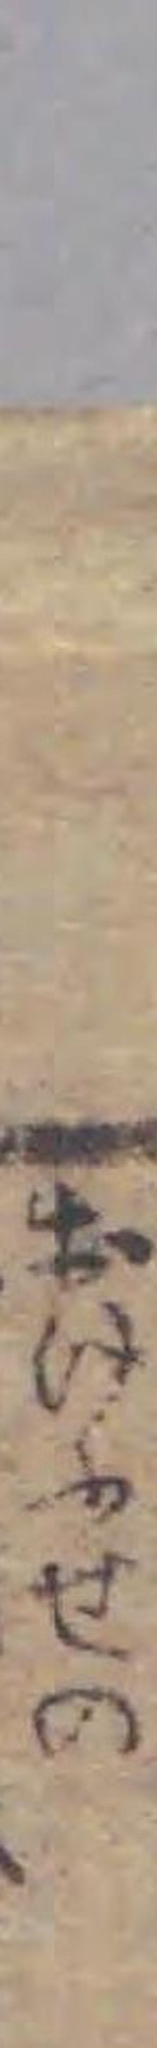おけふせの
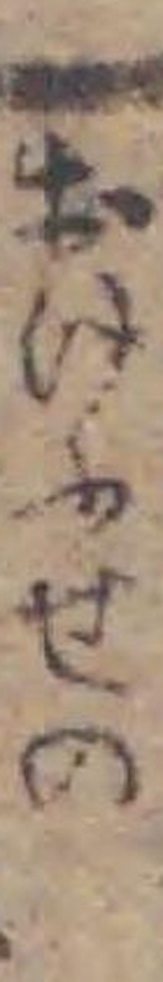おけふせの
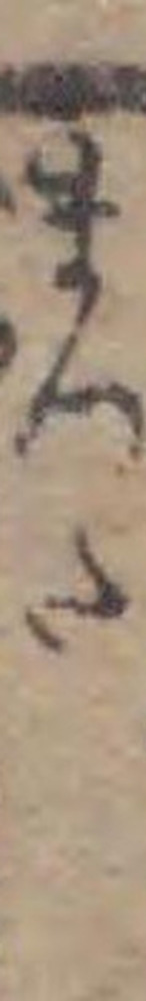まつた
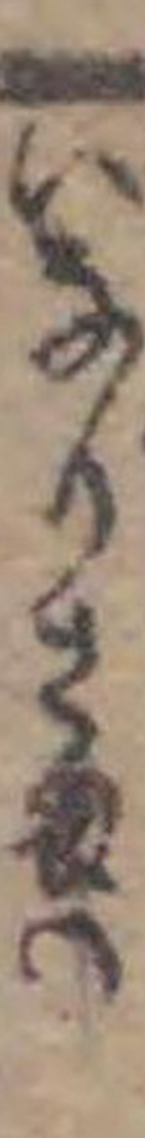いなりさまの
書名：北国順礼唄方便 : 3巻
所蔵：国立国会図書館 National Diet Library, JAPAN
